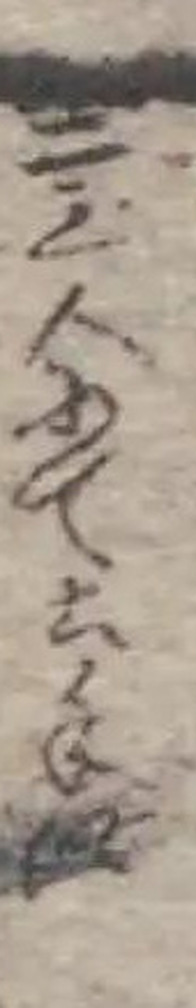二三人にて土手に
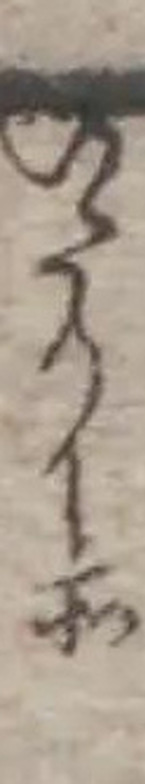いたりし所
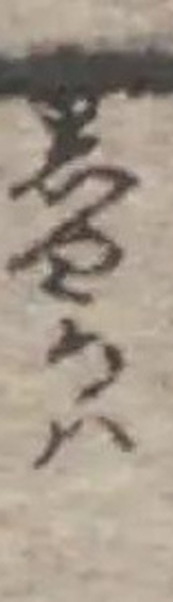しやかは
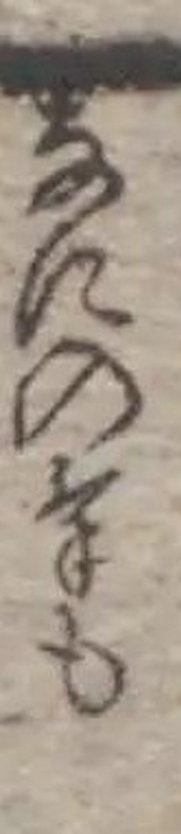なにの気も
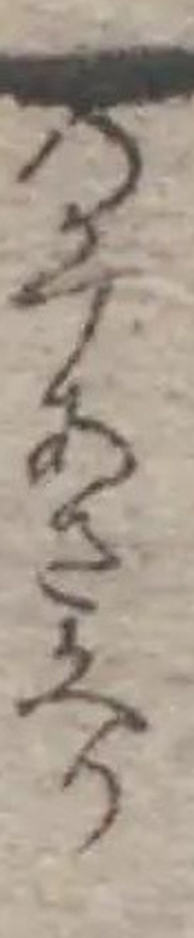かあさかへり
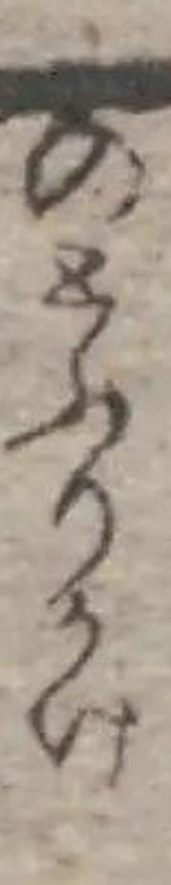のとふりかけ
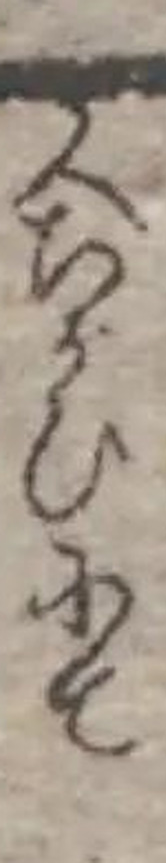人ちがひにて
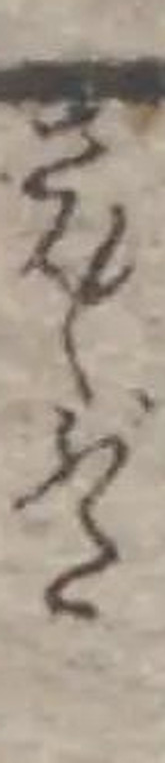さん〳〵ぶた
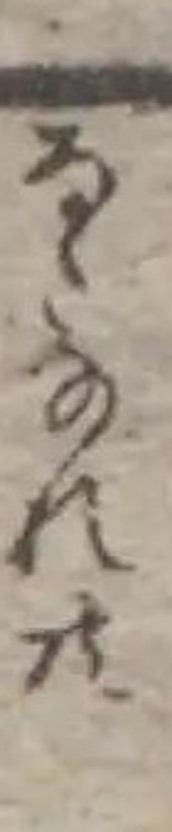るゝなれ共
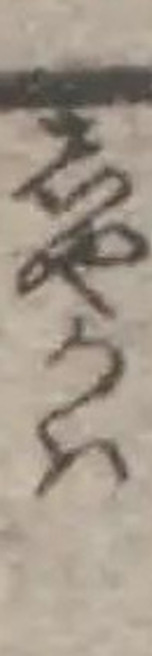しやかは
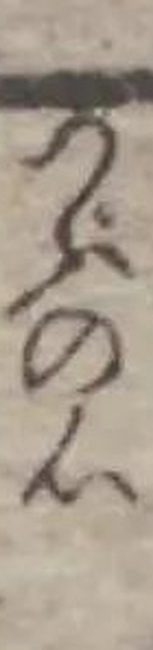つふの心
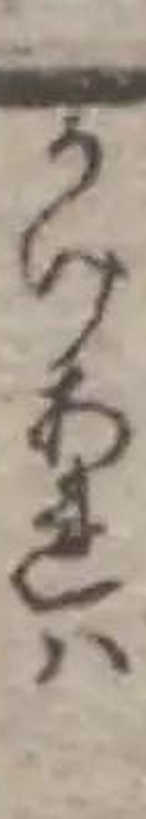かけあれば
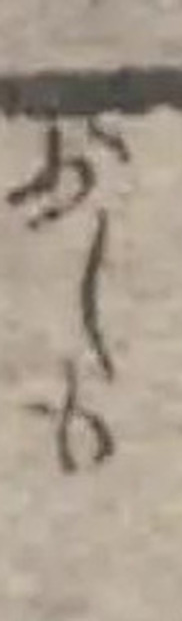少しも
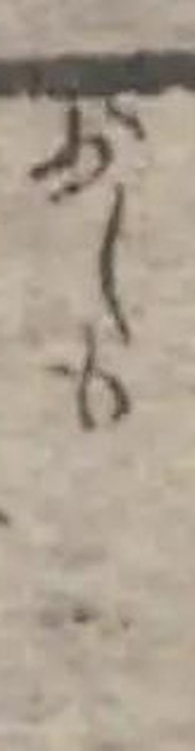少しも
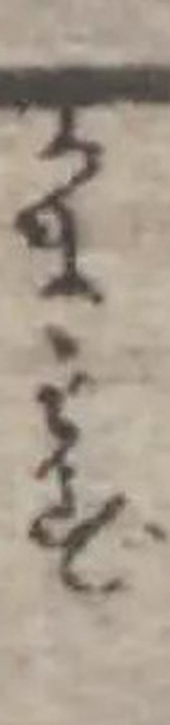かまはず
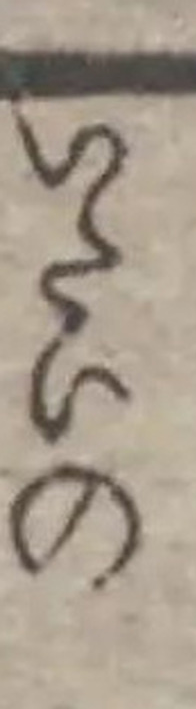いたいの
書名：早出来 3巻
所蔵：国立国会図書館 National Diet Library, JAPAN
